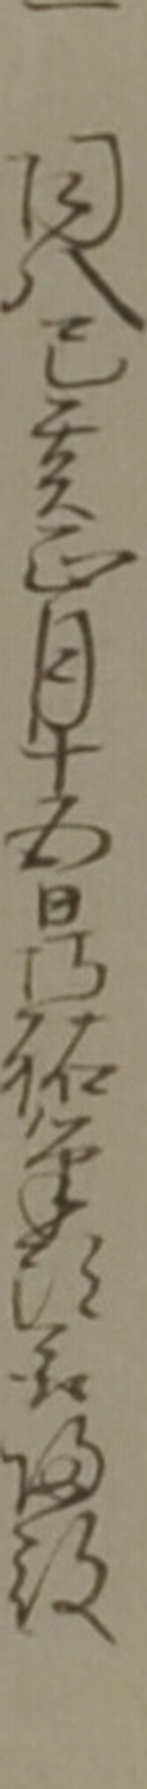一同八己亥正月十五日御祐筆頭取帰役
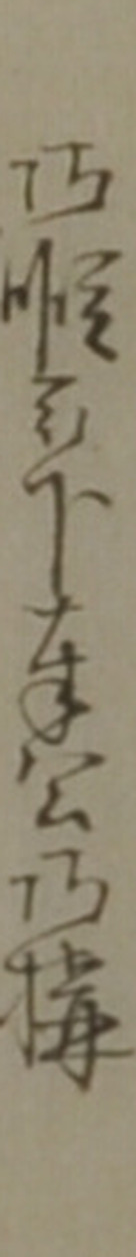御暇被下奉公御構

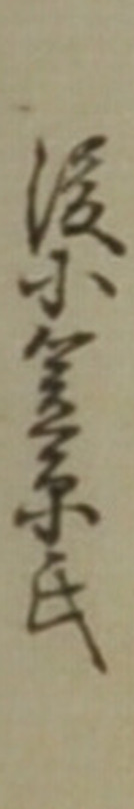後小笠原氏
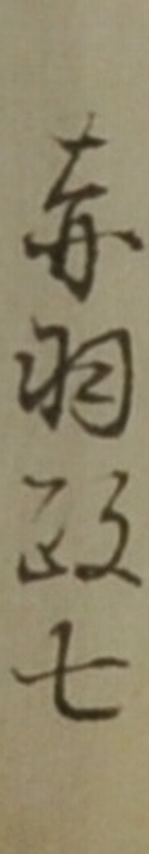赤羽政七
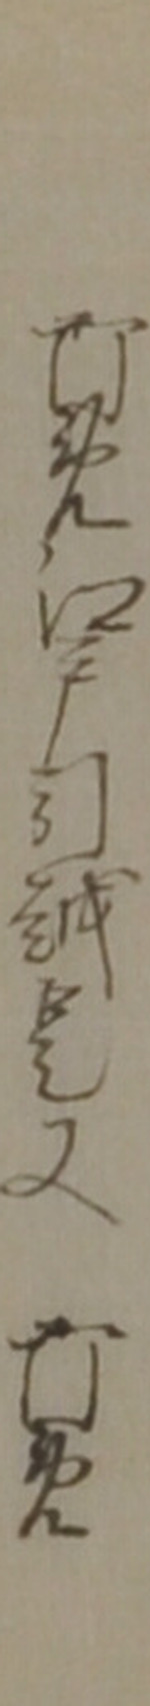御免江戸引越是又御免
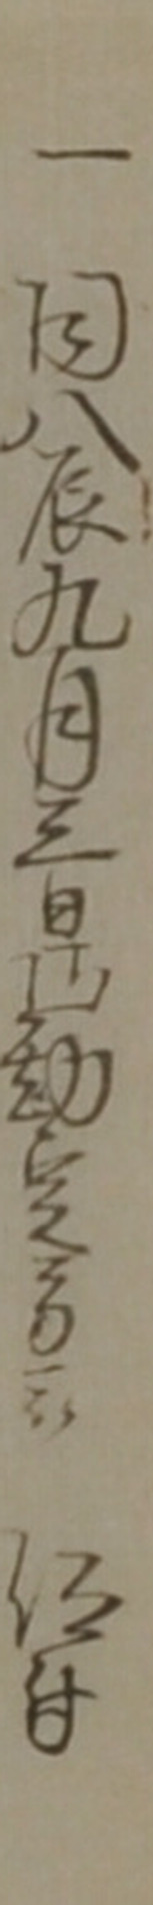一同八辰九月三日御勘定方被仰付
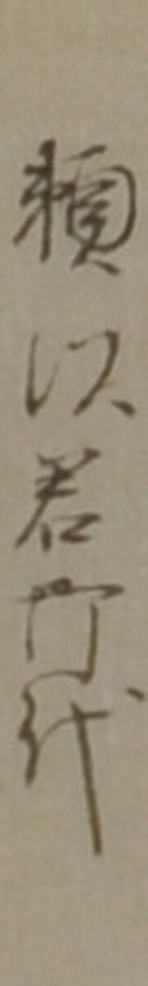頼以君御代
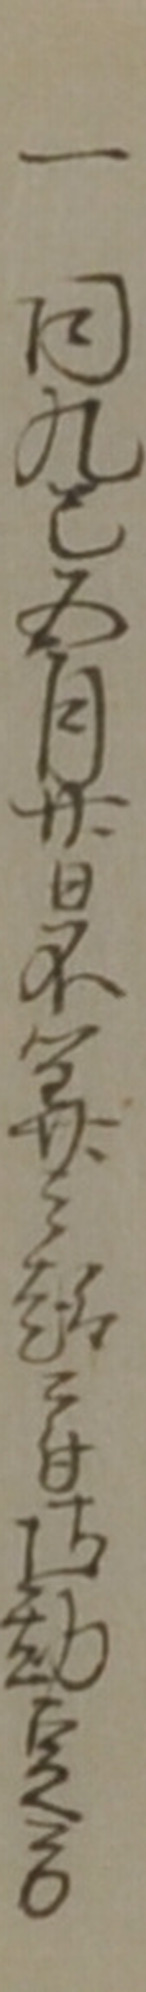一同九巳五月廿日不算之趣ニ付御勘定方
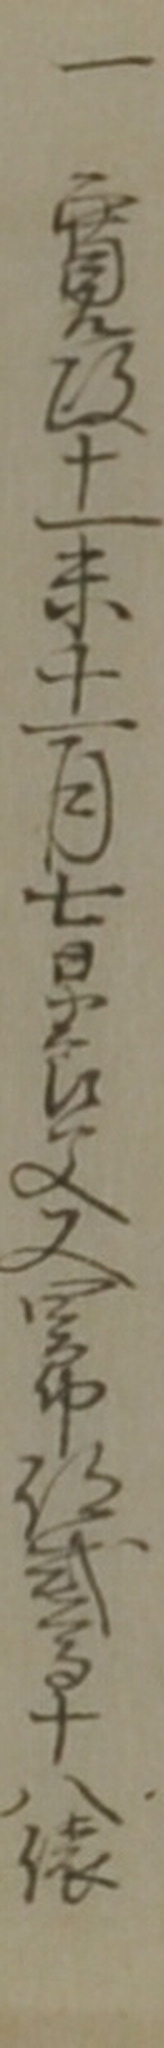一寛政十一未十一月七日養父又四郎跡式高十八俵
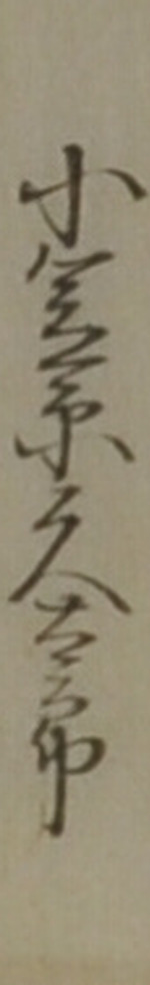小笠原久太郎
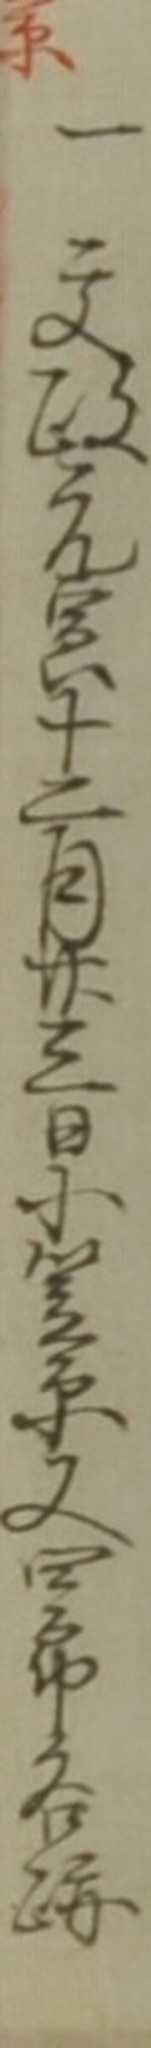一文政元寅十二月廿三日小笠原又四郎名跡
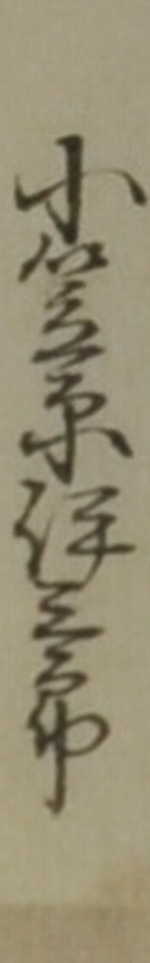小笠原伊三郎

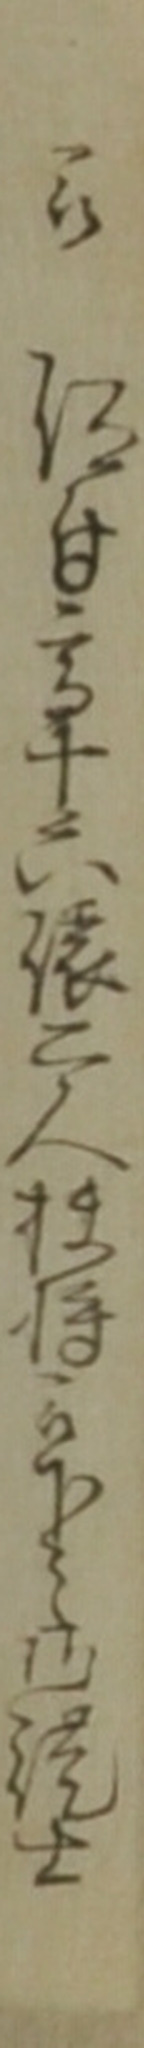被仰付高十六俵二人扶持被下之御徒士
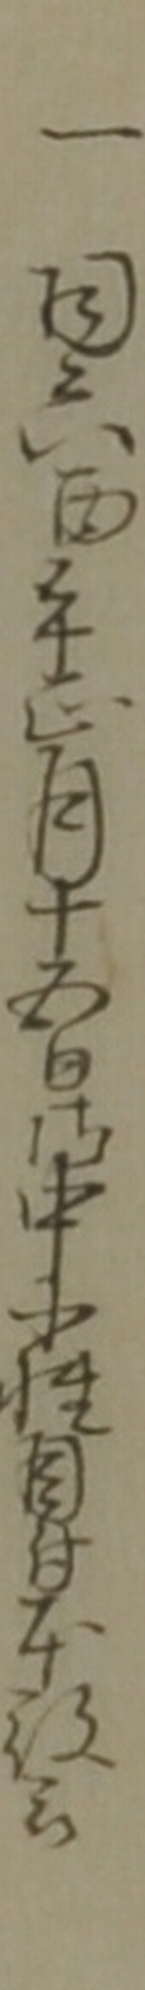一同六丙午正月十五日御中小性目付本役被
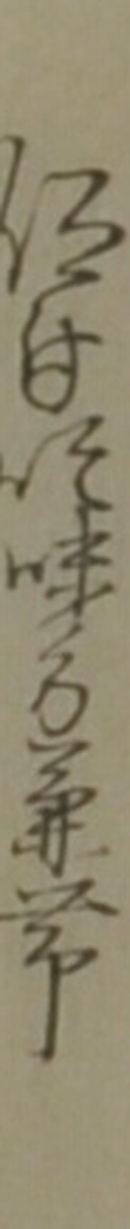仰付吟味方兼帯

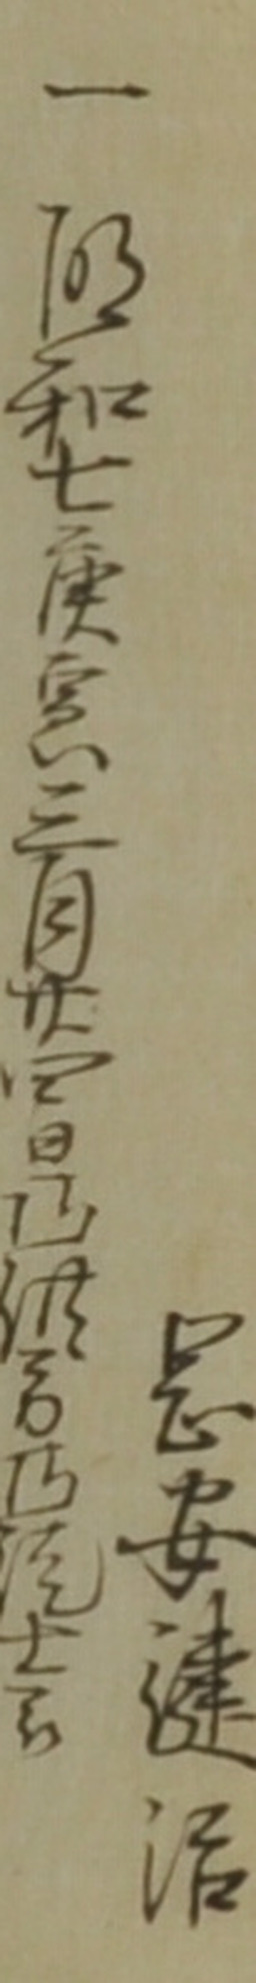一明和七庚寅三月廿四日御供方御徒士被
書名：無足廃家（壱）
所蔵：伊那市立高遠町図書館・合同会社AMANE
